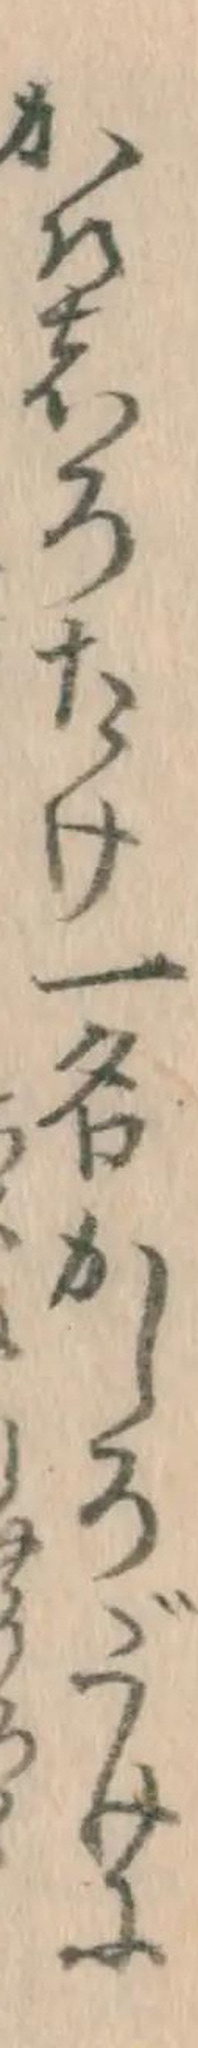かはしろたけ一名かしろだけに
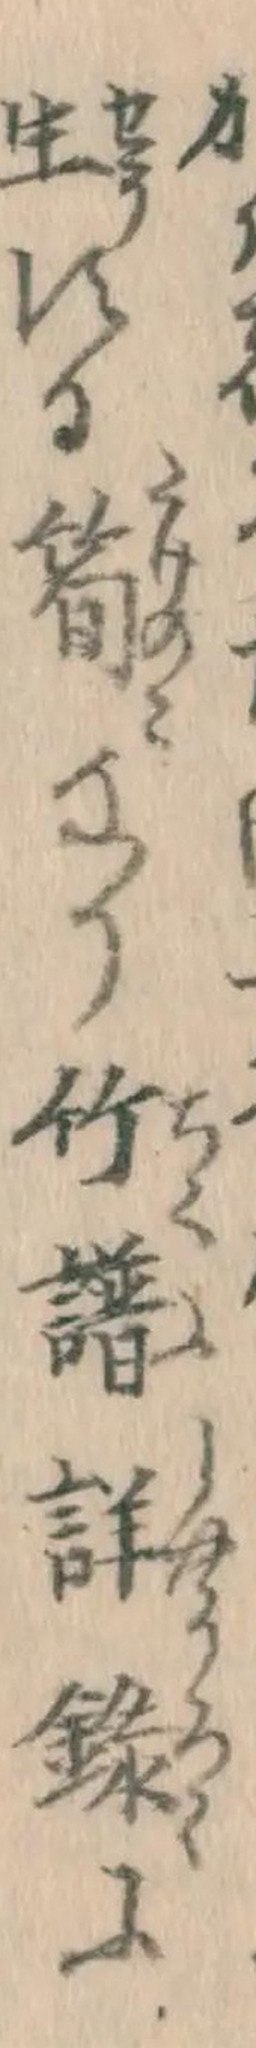生する筍なり竹譜詳録に

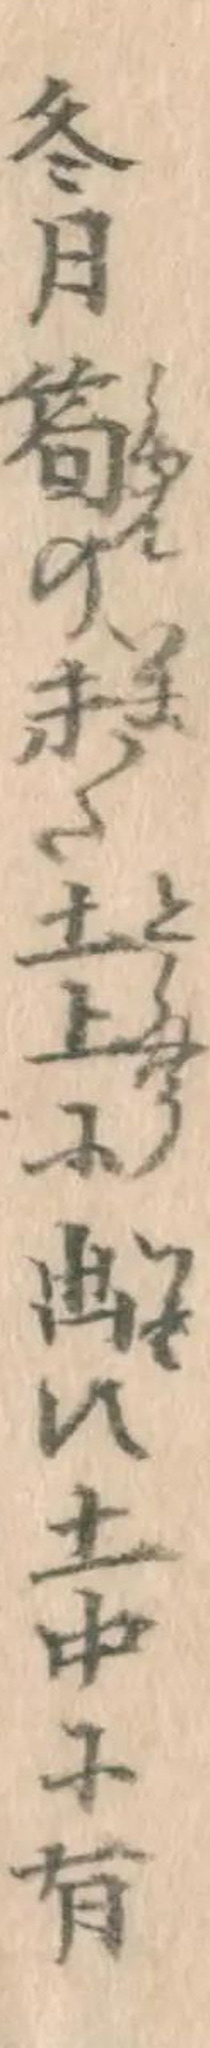冬月筍の未た土上に出す土中に有
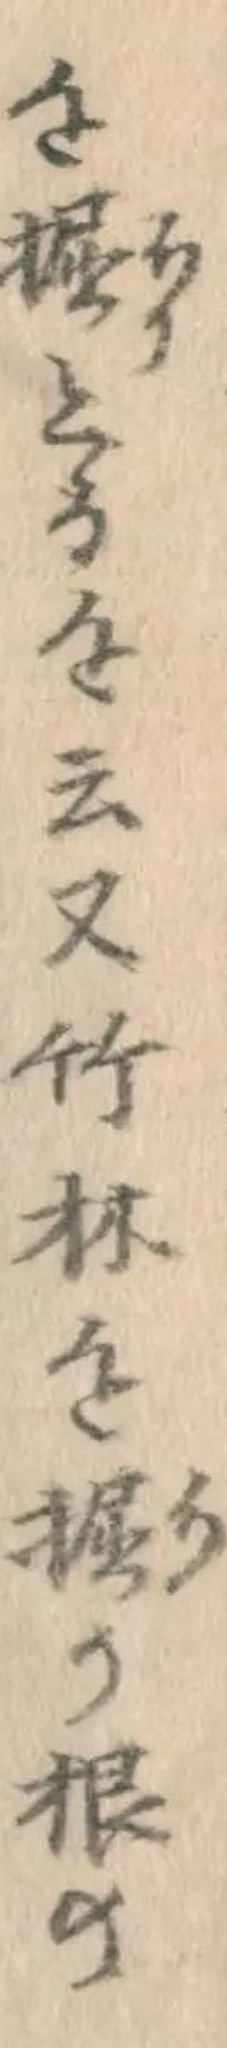を掘とるを云又竹林を掘り根の
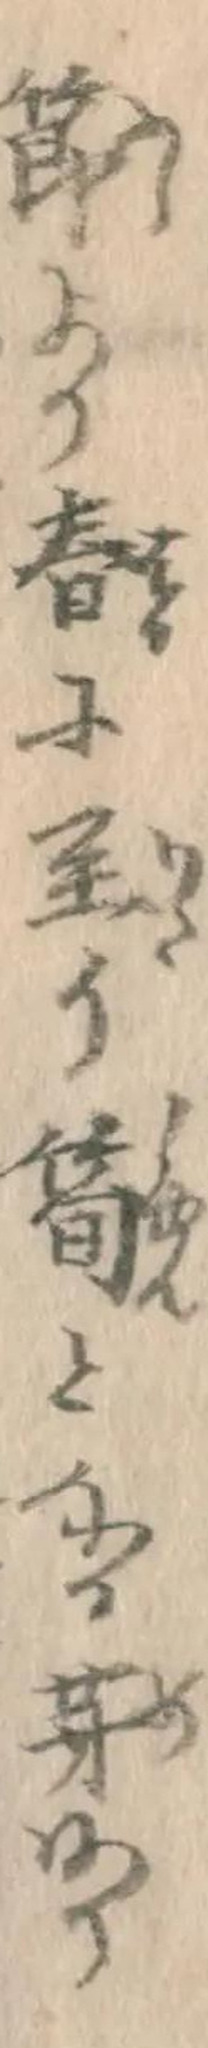節より春に至り筍となる芽あり
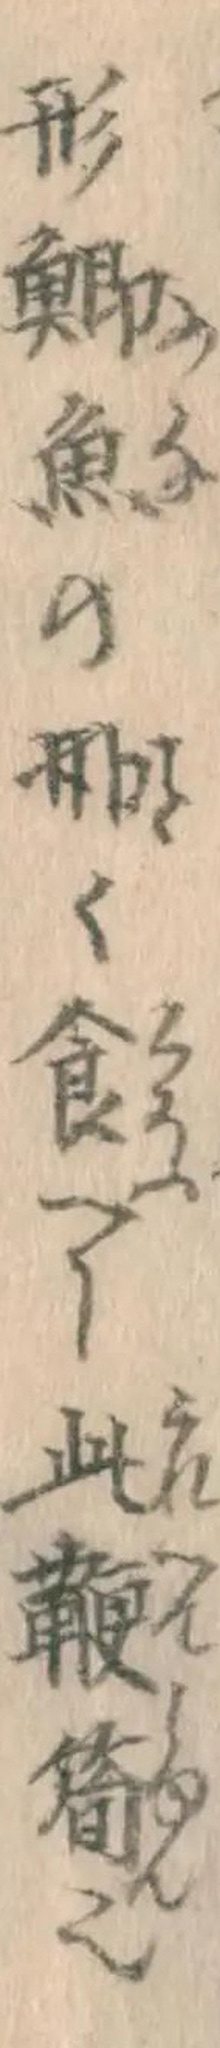形鯽魚の如く食へし此鞭筍也
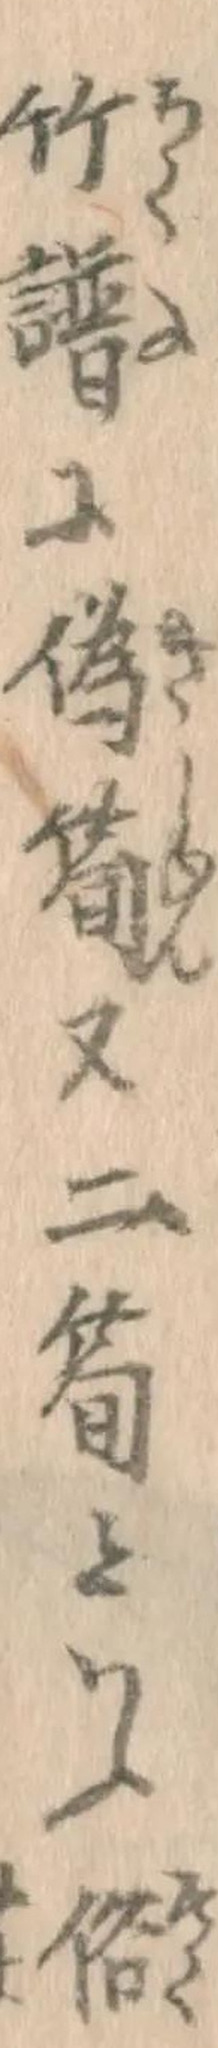竹譜に偽筍又二筍といふ俗
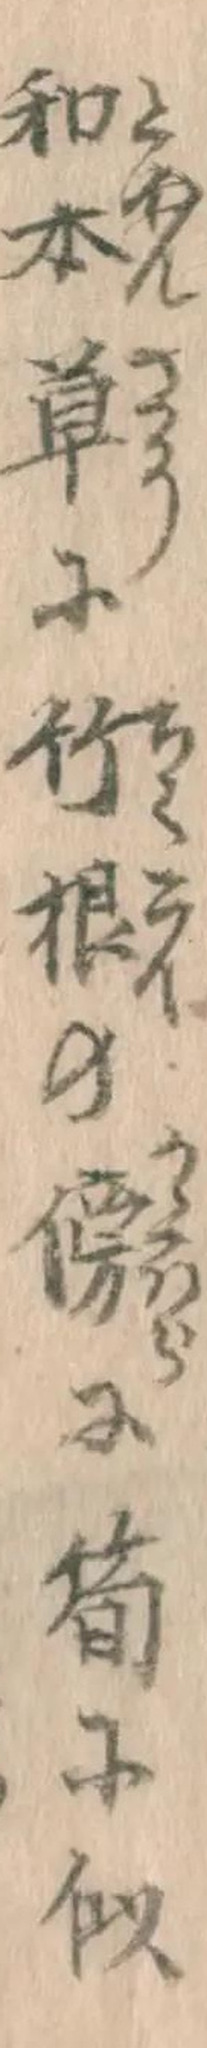和本草に竹根の傍に筍に似
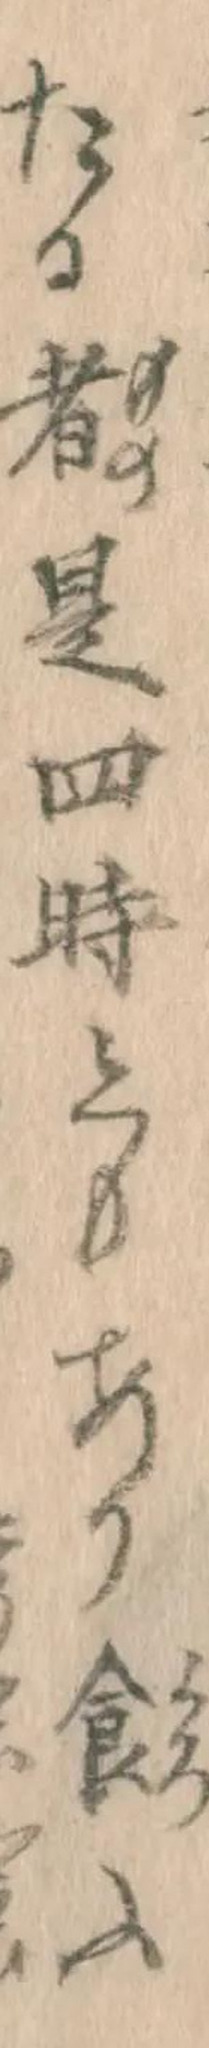たる者是四時ともあり食ふ
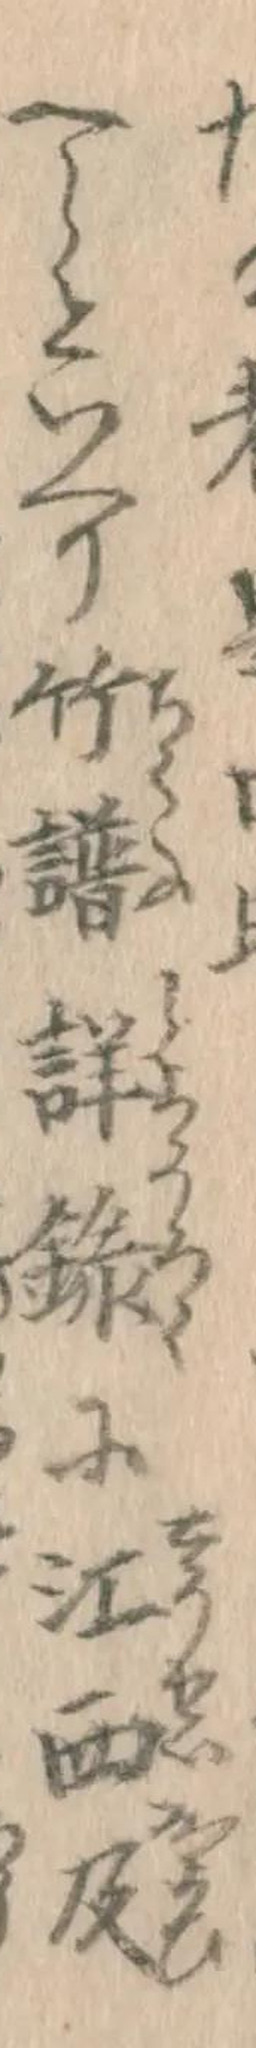へしといへり竹譜詳録に江西及
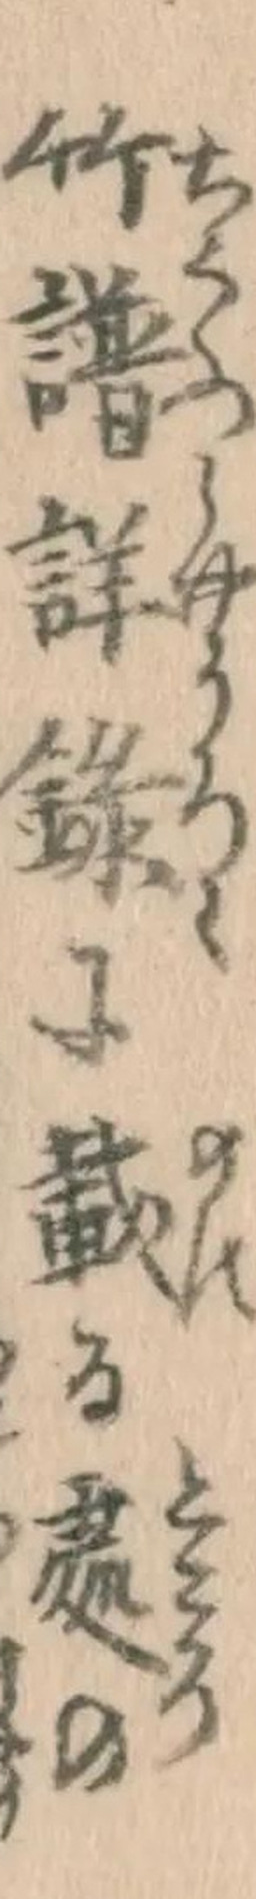竹譜詳録に載る処の

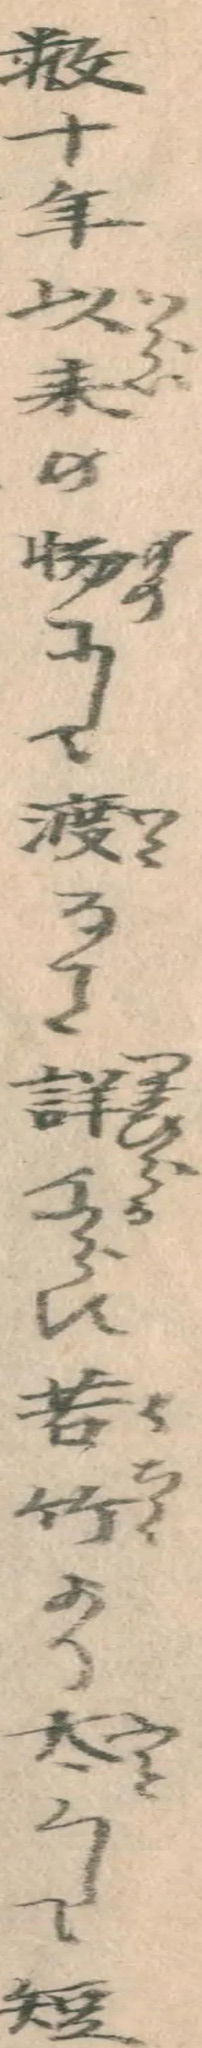数十年以来の物にして渡ること詳ならす苦竹より太くして短
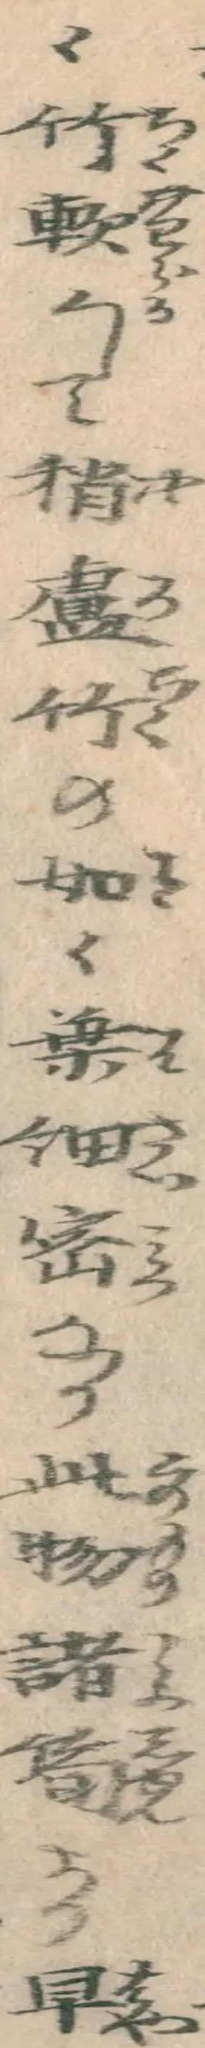く竹軟くして稍盧竹の如く葉細密なり此物諸筍より早
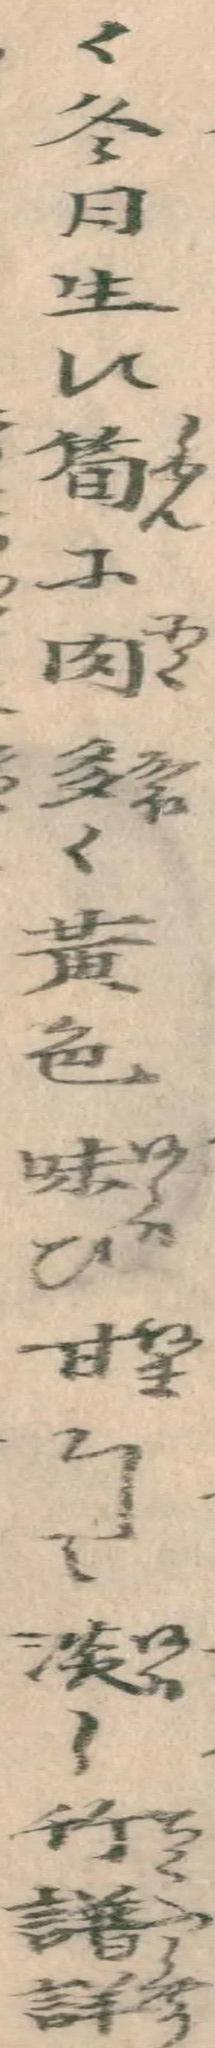く冬月生す筍に肉多く黄色味ひ甘くして淡し竹譜詳
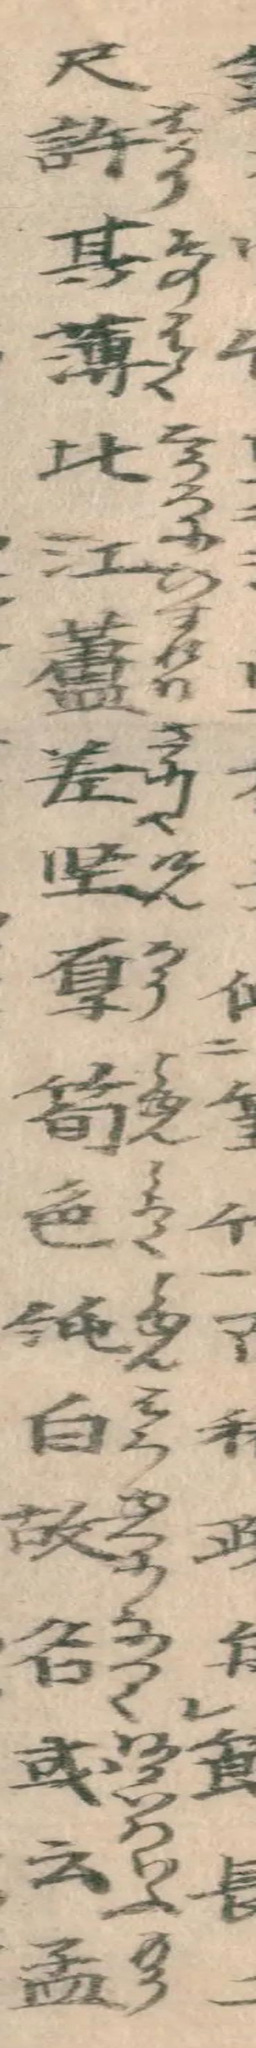尺許其薄比江芦差堅厚筍色純白故名或云孟
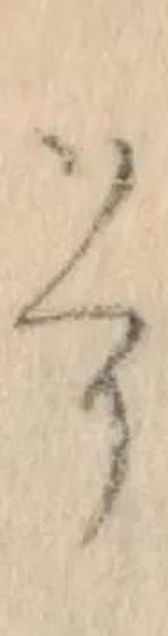いへり
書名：本草図譜. 巻52-54
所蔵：国立国会図書館 National Diet Library, JAPAN
